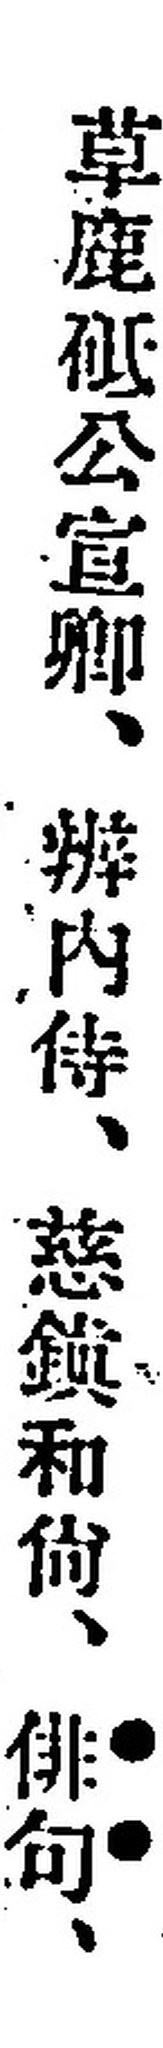草鹿砥公宣卿、弁内侍、慈鎮和尚、俳句、
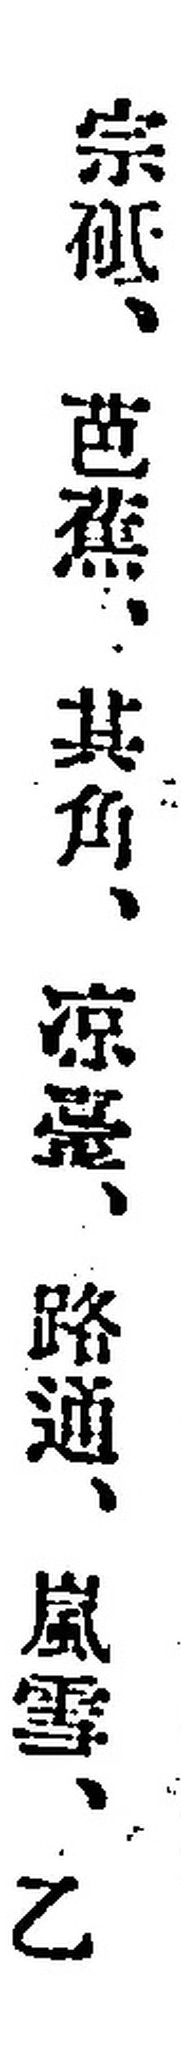宗砥、芭蕉、其角、凉台、路通、嵐雪、乙
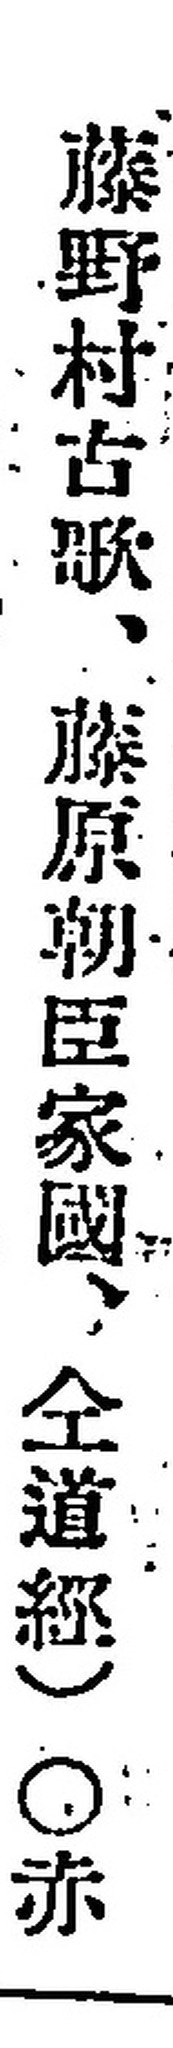藤野村古歌、藤原朝臣家国、仝道経)○赤
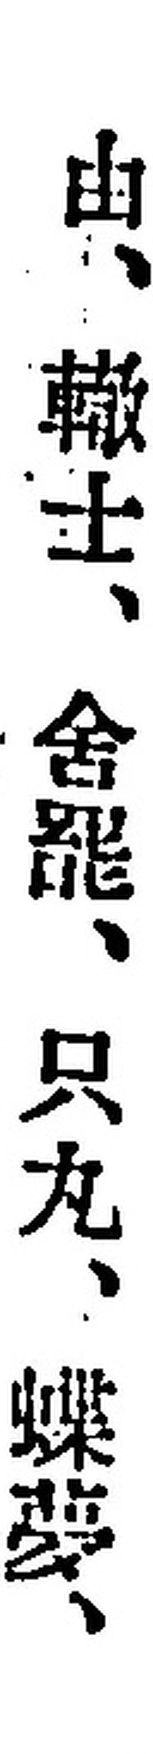由、轍士、舎罷、只丸、蝶夢、
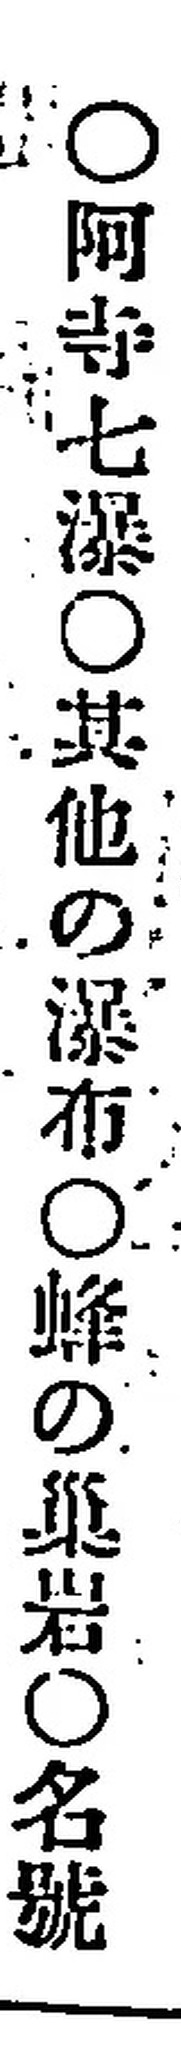○阿寺七瀑○其他の瀑布○蜂の巣岩○名号
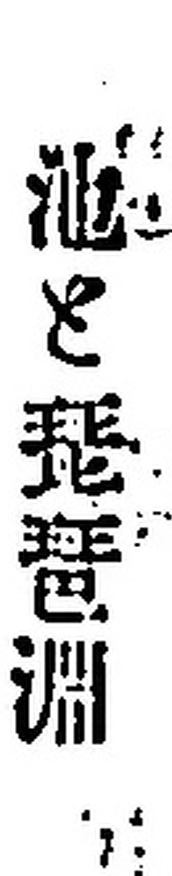池と琵琶淵
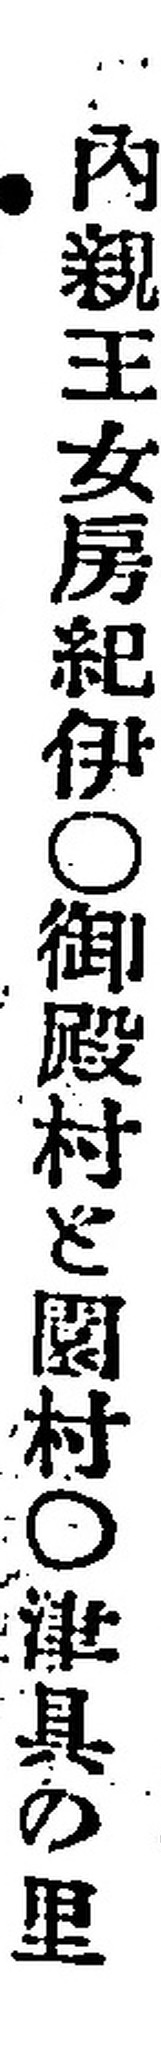内親王女房紀伊○御殿村と園村○津具の里
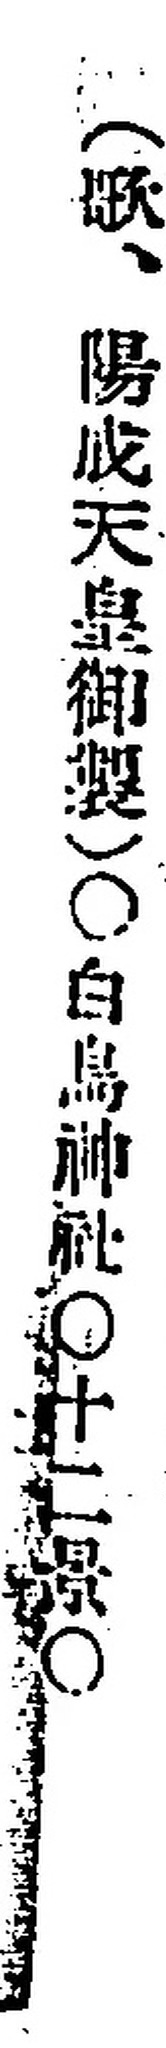(歌、陽成天皇御製)○白鳥神社○十二景○
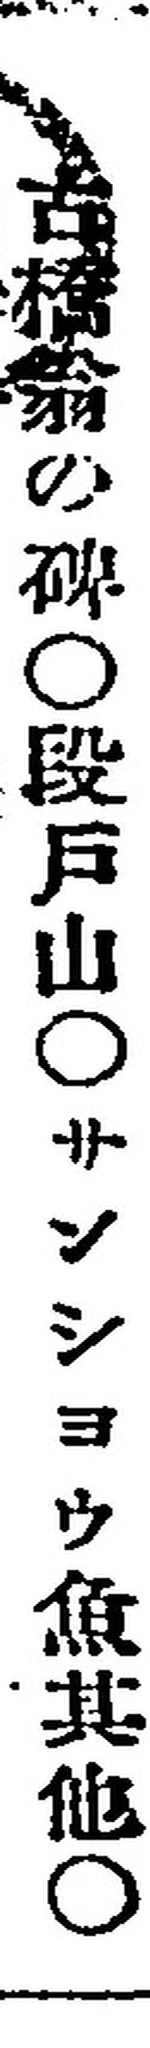古橋翁の碑○段戸山○サンシヨウ魚其他○
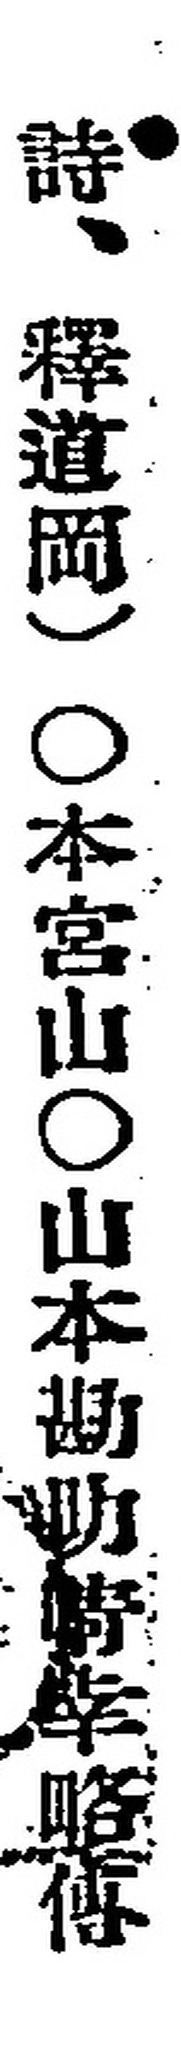詩、釈道岡)○本宮山○山本勘助晴幸略伝
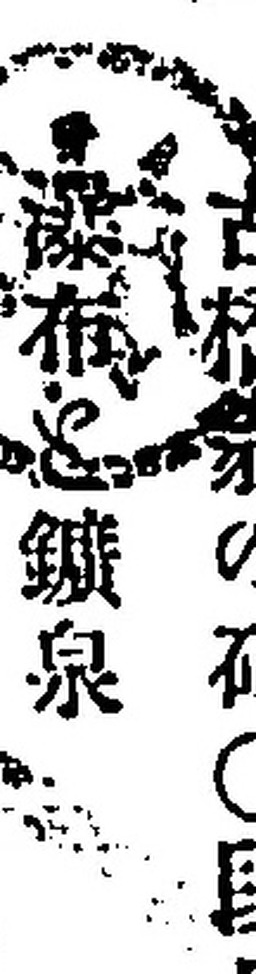瀑布と鉱泉
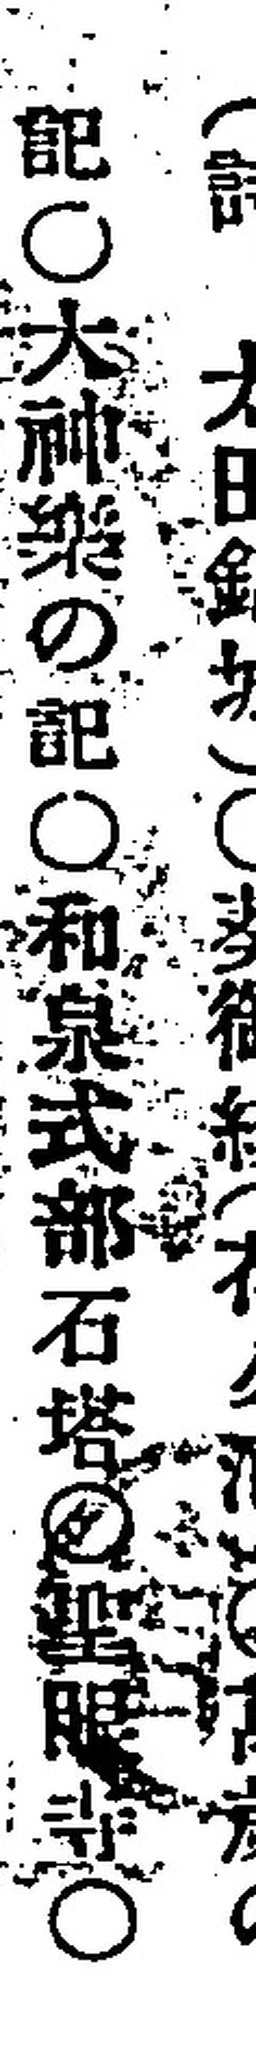記○大神楽の記○和泉式部石塔○聖眼寺○
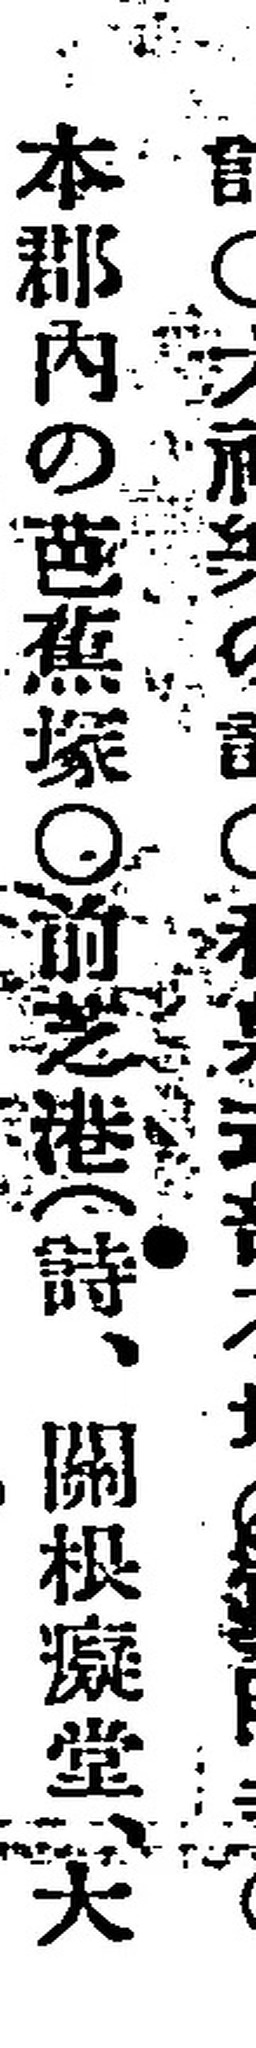本郡内の芭蕉塚○前芝港(詩、関根痴堂、大
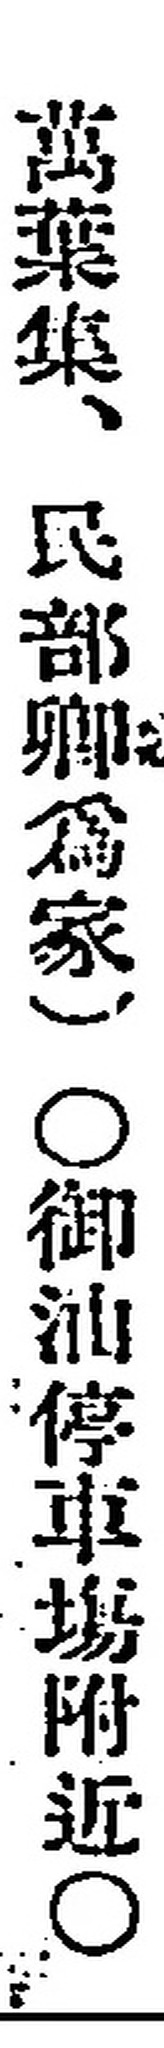万葉集、民部卿為家)○御油停車場附近○
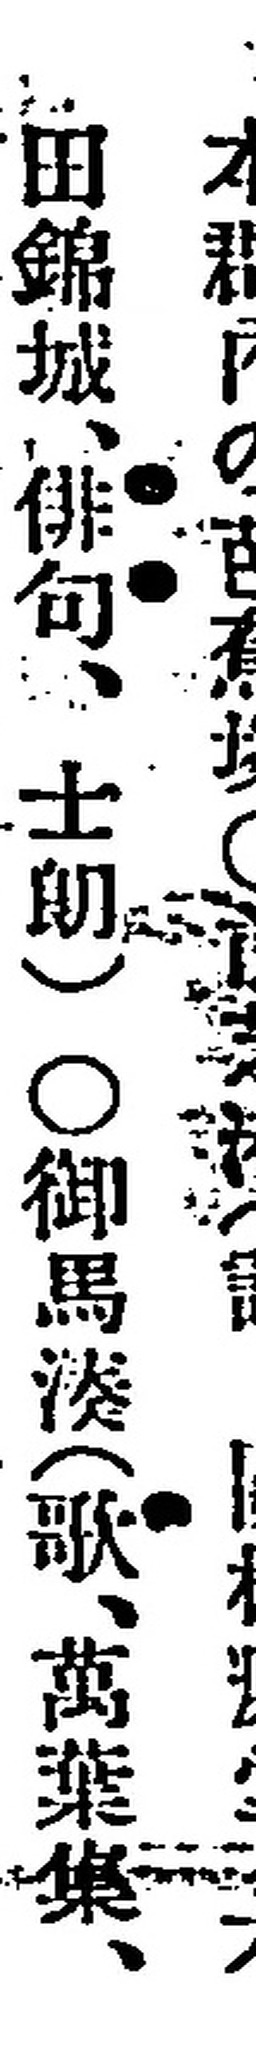田錦城、俳句、士朗)○御馬湊(歌、万葉集、
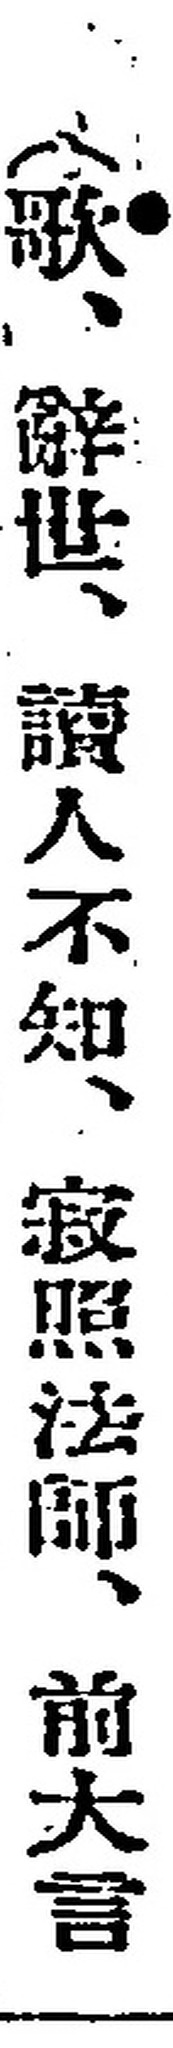(歌、辞世、読人不知、寂照法師、前大言
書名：東参名勝案内
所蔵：国立国会図書館 National Diet Library, JAPAN
